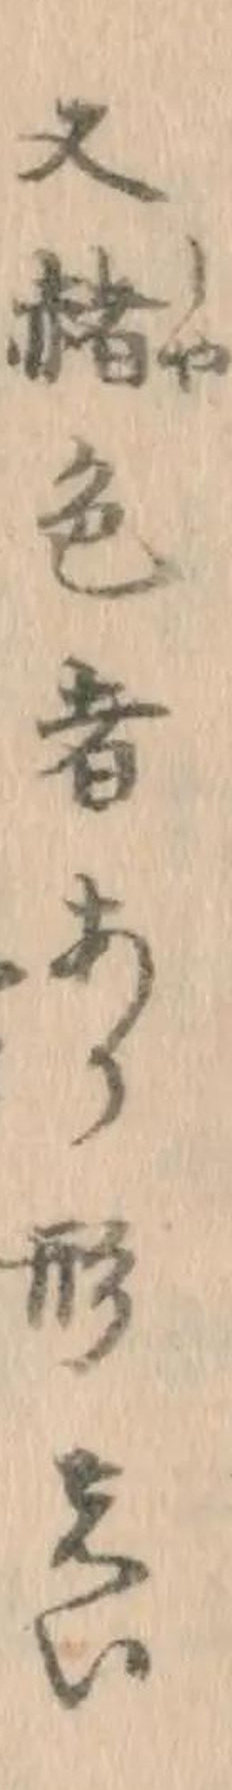又赭色者あり形しい
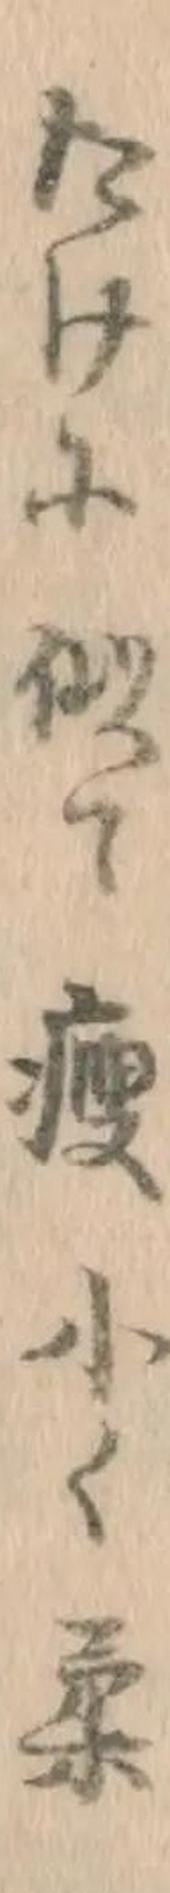たけに似て痩小く柔
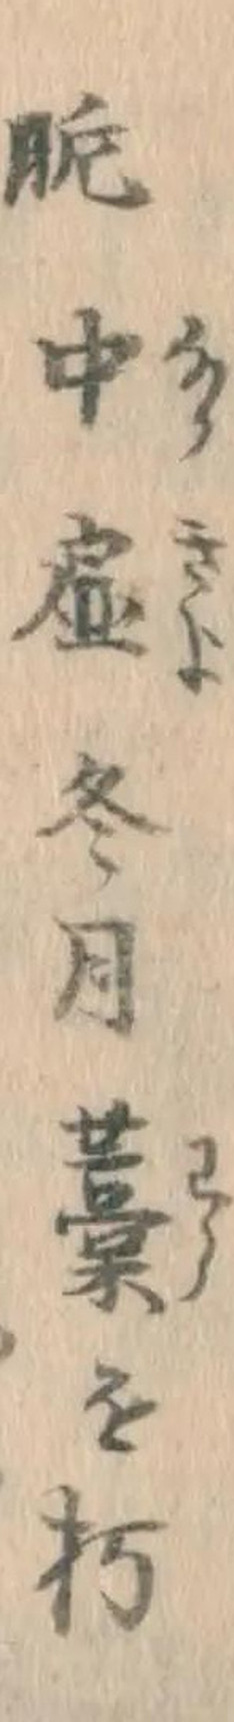脆中虚冬月藁を朽
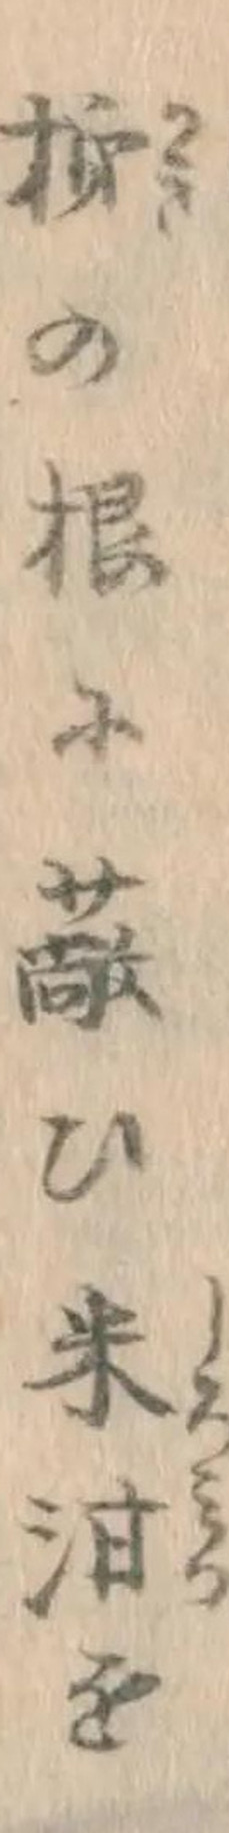柿の根に蔽ひ米泔を
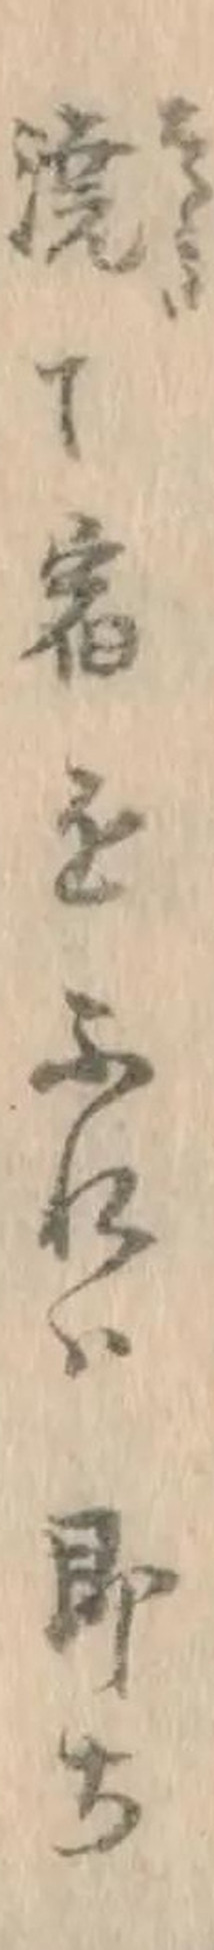澆て宿をふれは即ち
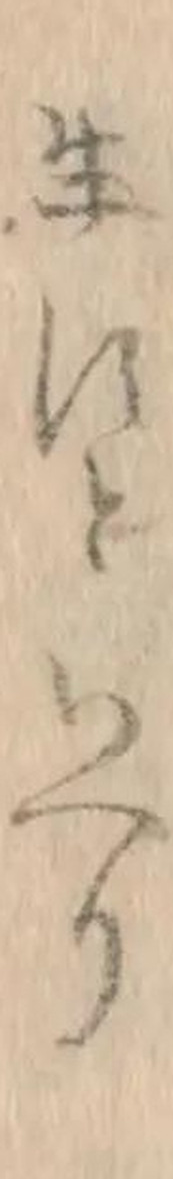生すといへり

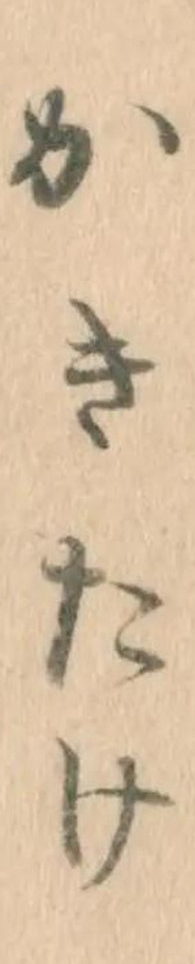かきたけ
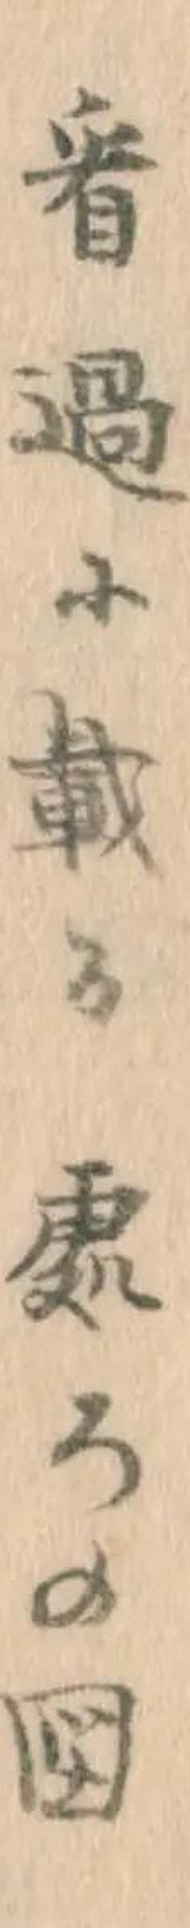看過に載る処ろの図
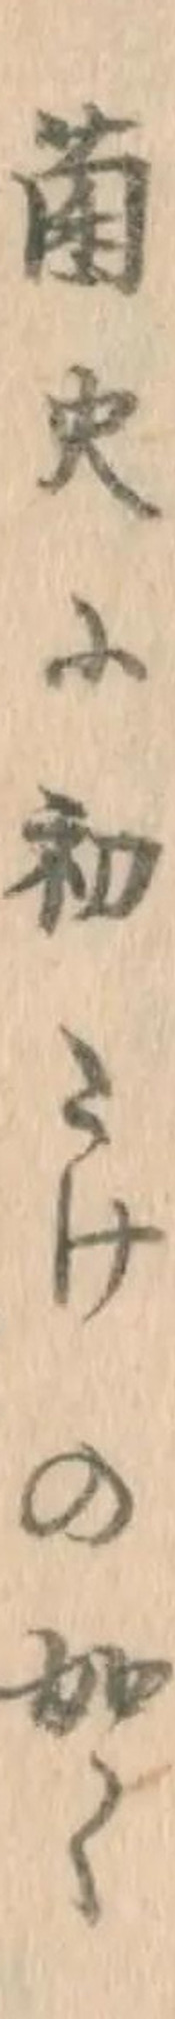菌史に初たけの如く
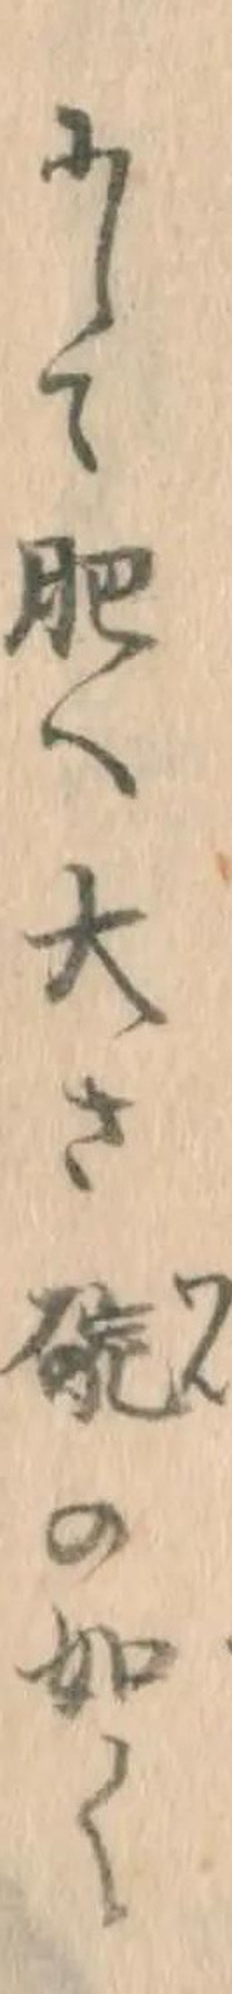にして肥へ大さ碗の如く
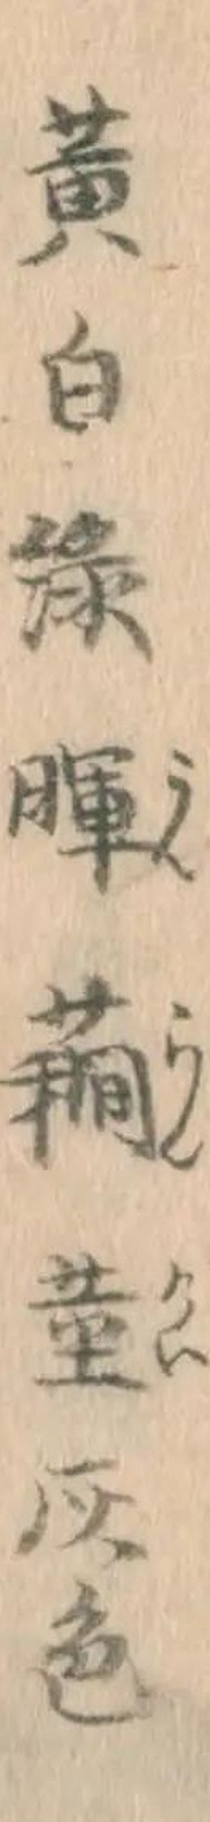黄白緑茎灰色
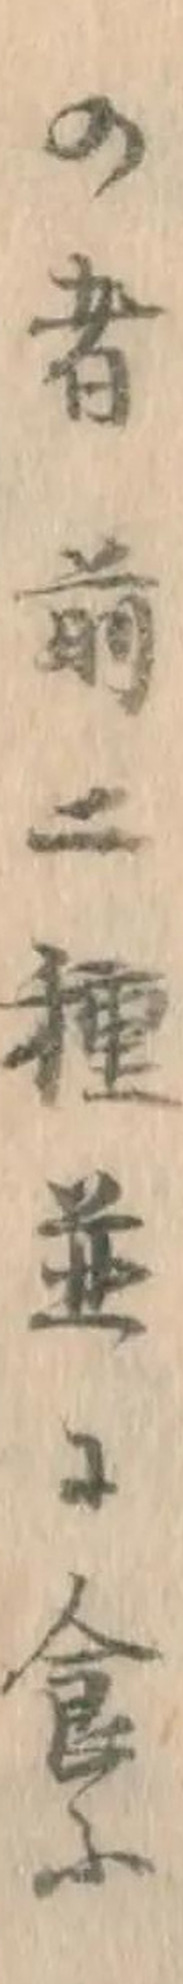の者前二種並に食ふ
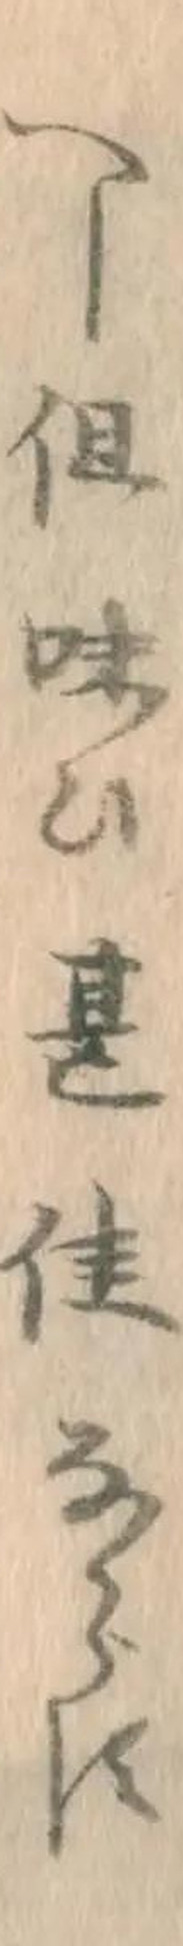へし但味ひ甚佳ならす
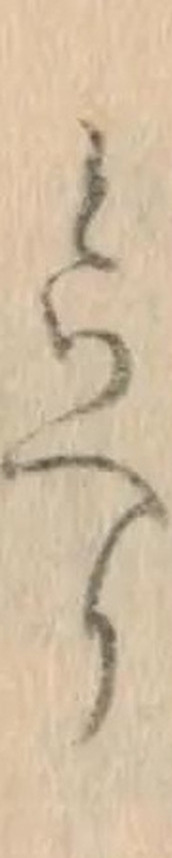といへり
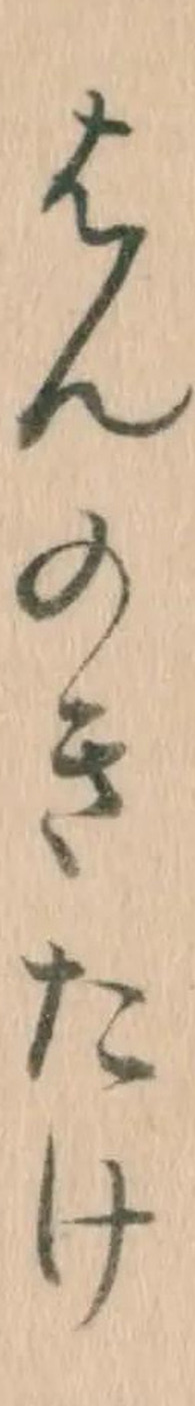はんのきたけ
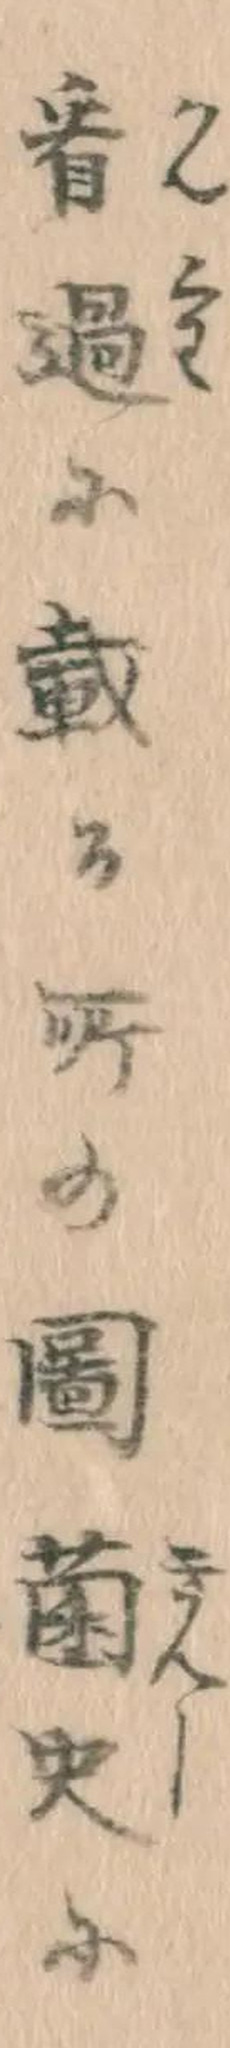看過に載る所の図菌史に
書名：本草図譜. 巻55-57
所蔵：国立国会図書館 National Diet Library, JAPAN
